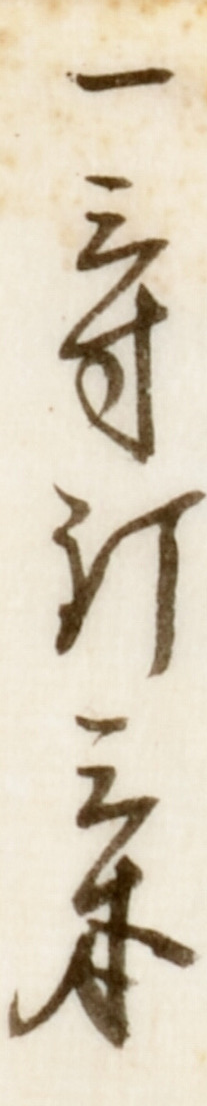一三寸釘三本
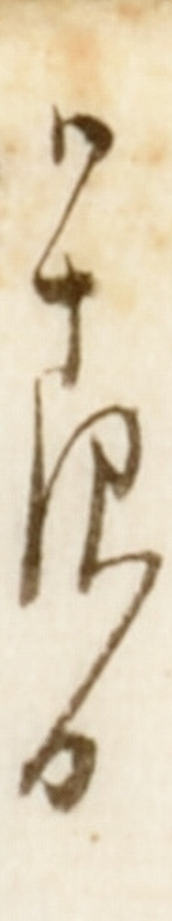同十四日
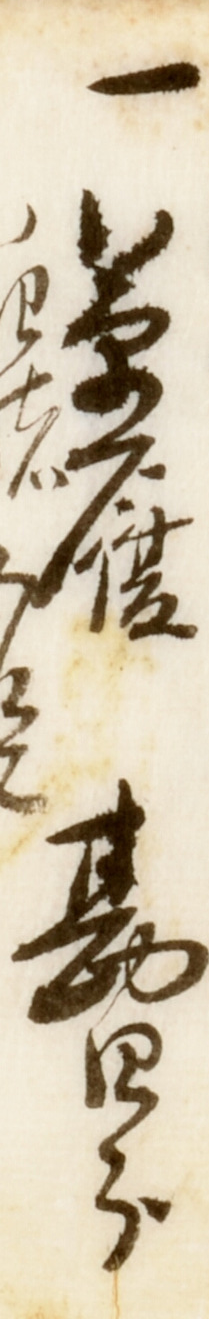一草履勘四郎
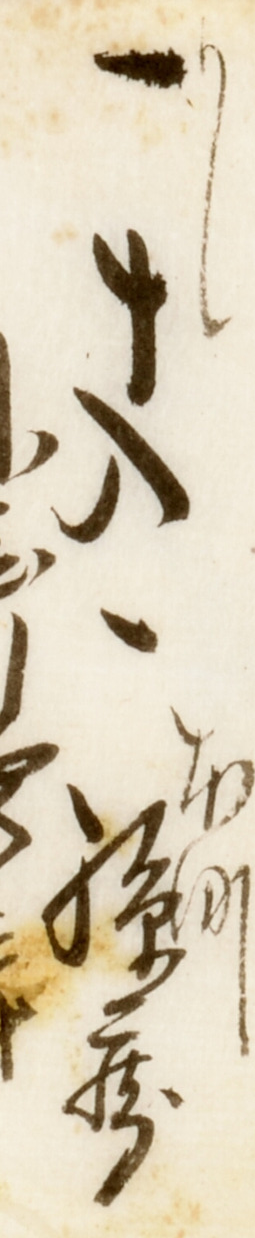一十入ゝ孫蔵
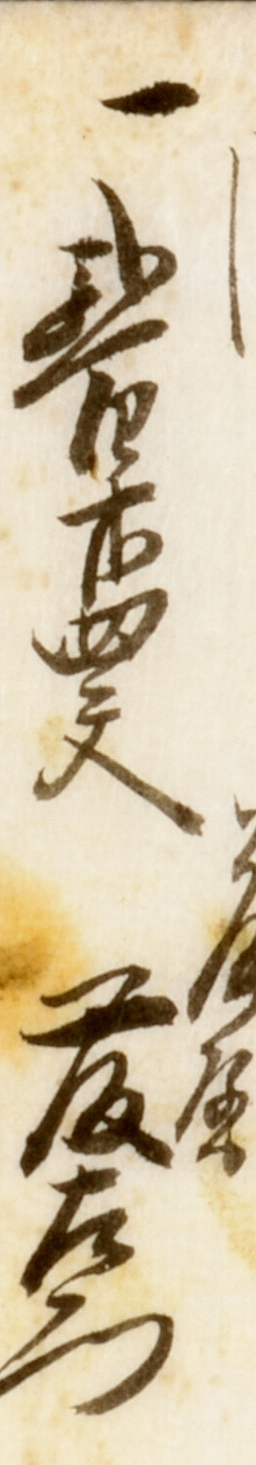一弐百廿四文藤左衛門
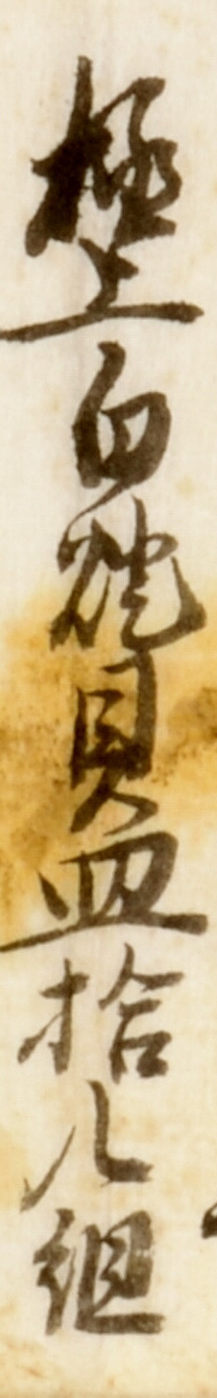極上白燈貝皿拾八組

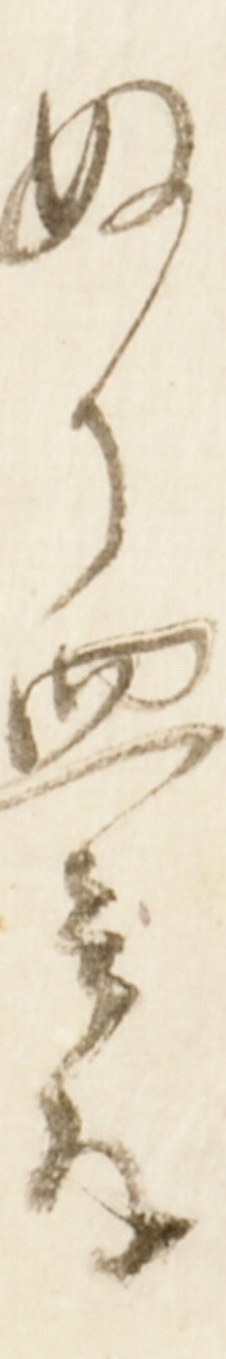ぬり皿壱枚
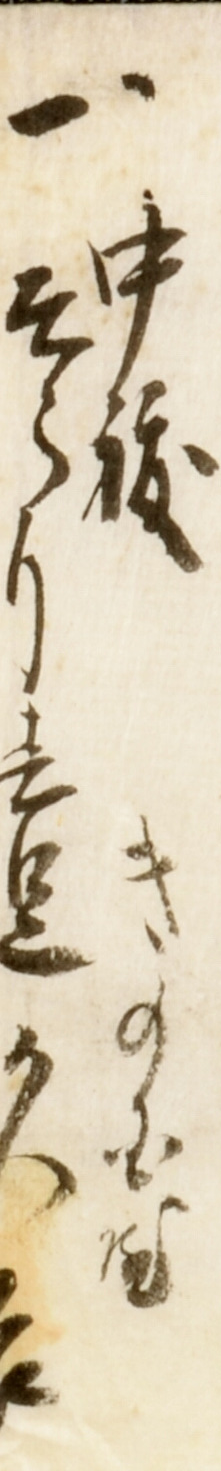一そうり伝七
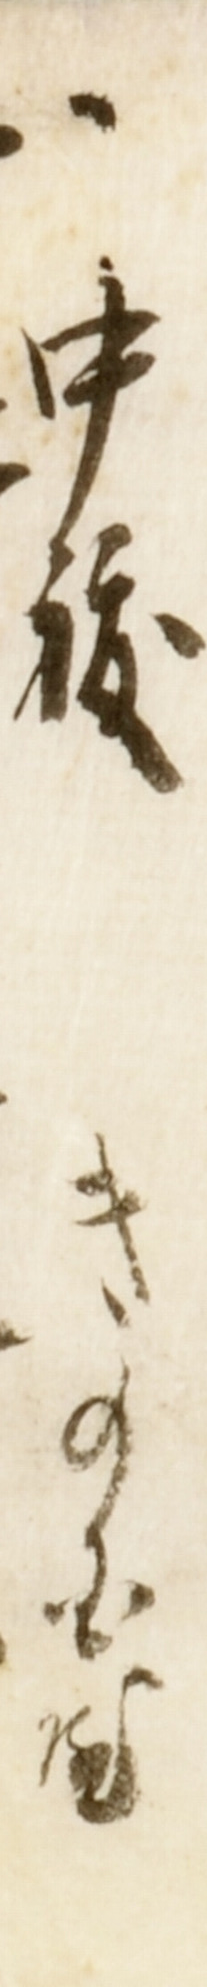同中抜きの国屋
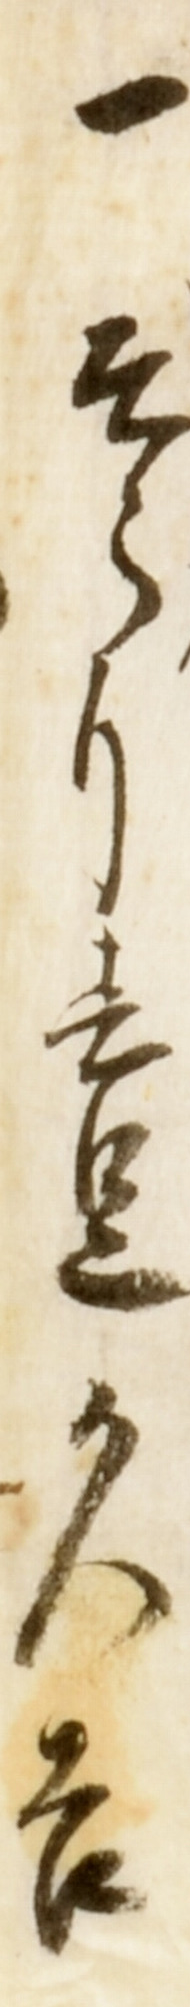一そうり壱足久吉
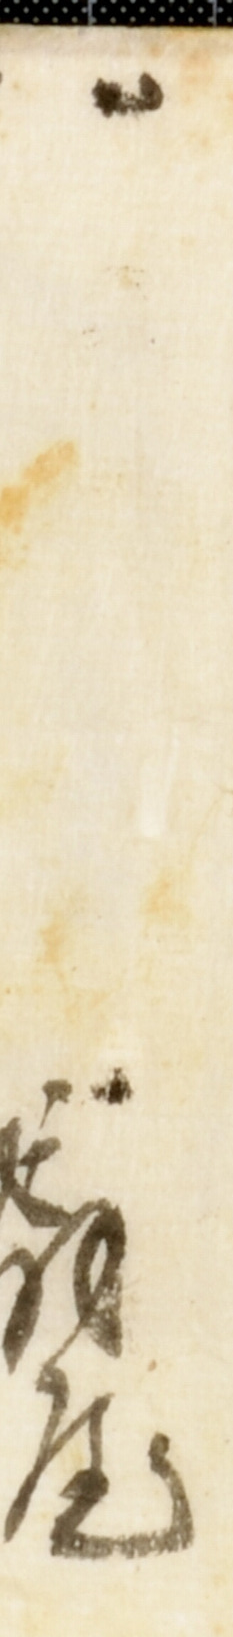同扇屋
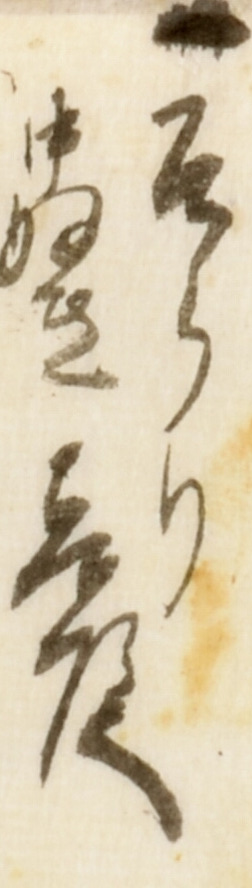中ぬき壱双
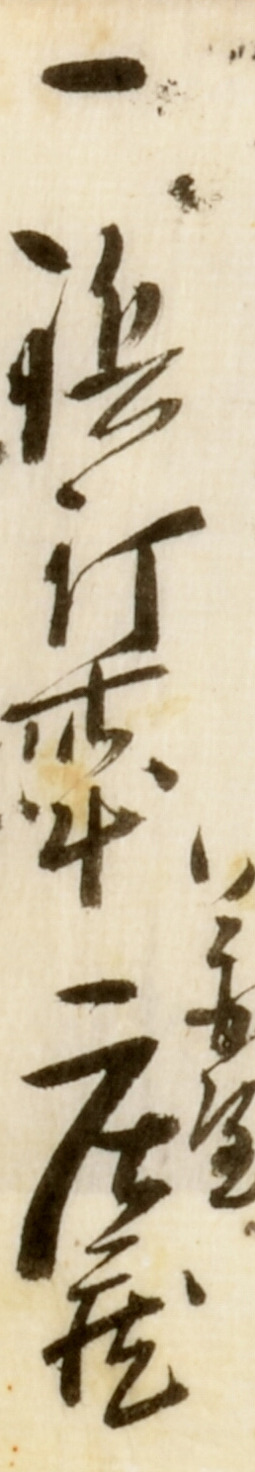一鋲釘卅斗庄蔵
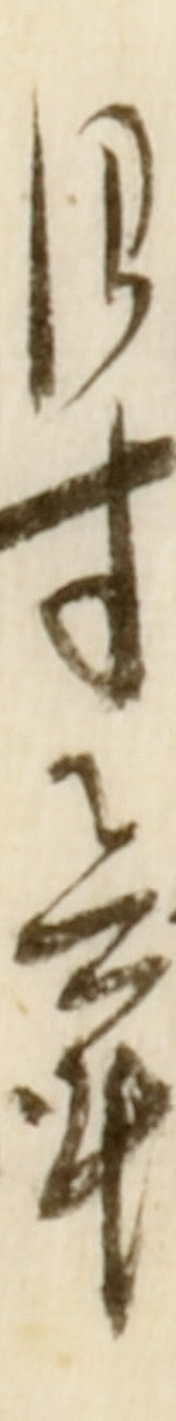四寸壱斗
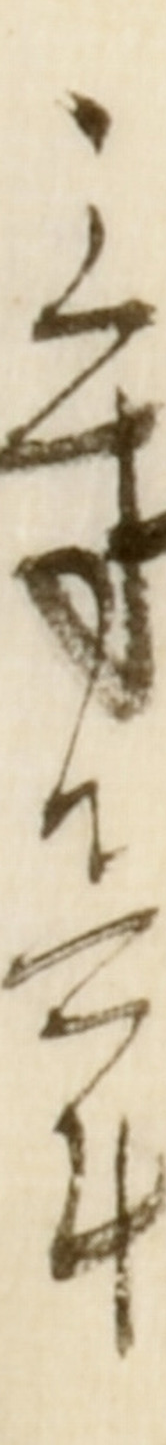三寸壱斗
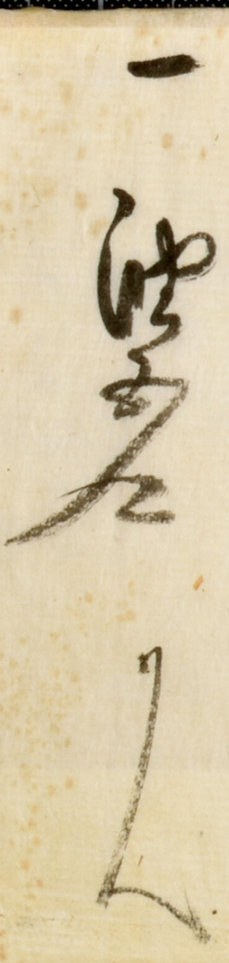一油五合同人
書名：御用諸色買物帳
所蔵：伊那市立高遠町図書館・合同会社AMANE
